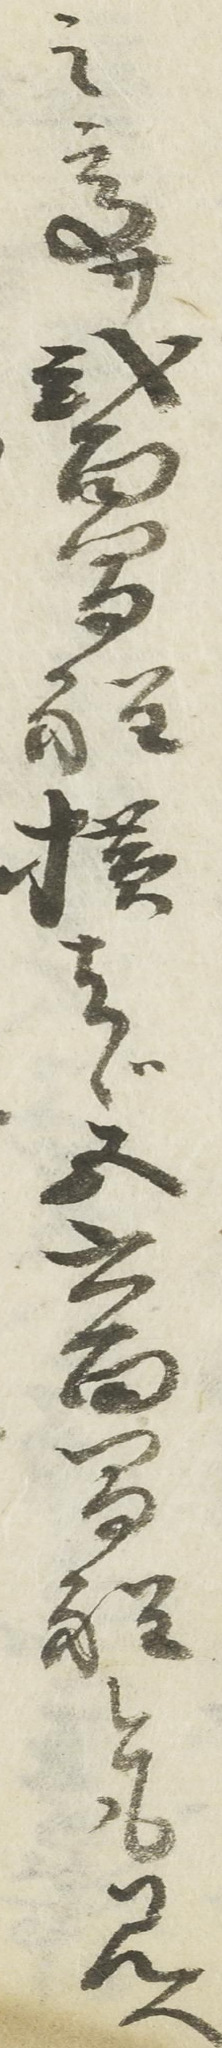之高サ弐百間横はば五六百間程とも見へ
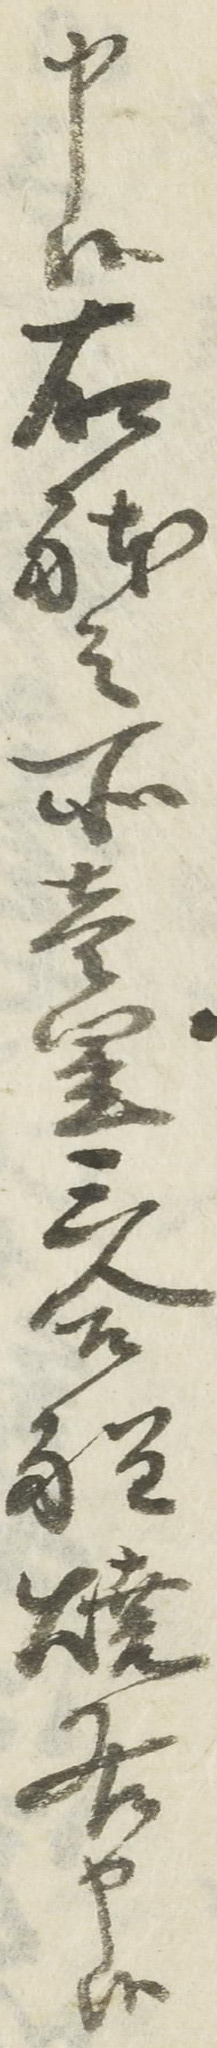申候右躰之所壱里三合程焼居申候
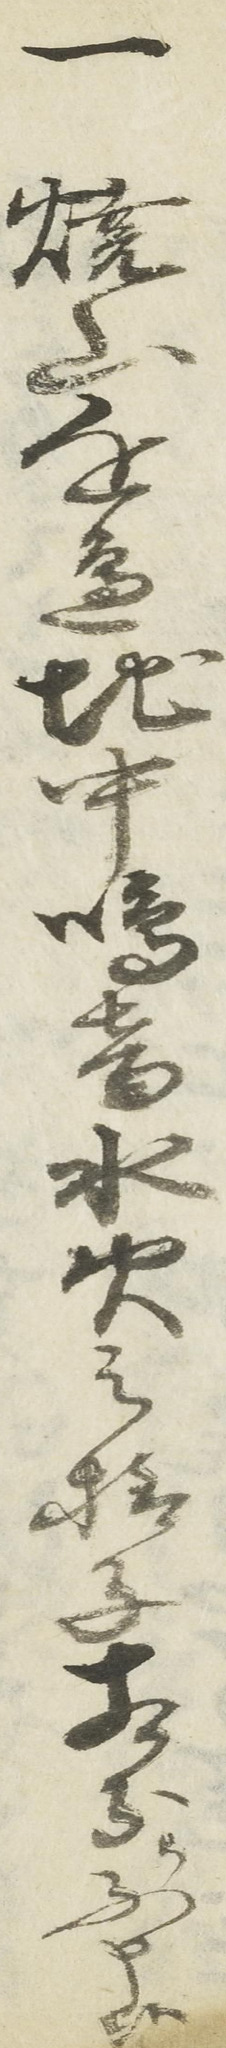一焼山近辺地中鳴音水火之様子相分り不申候
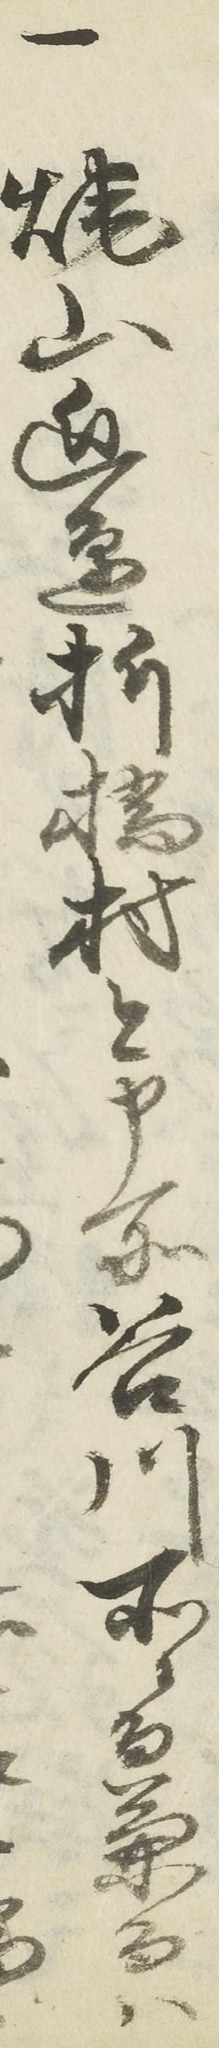一焼山近辺迄折橋村と申所谷川所に而兼而は
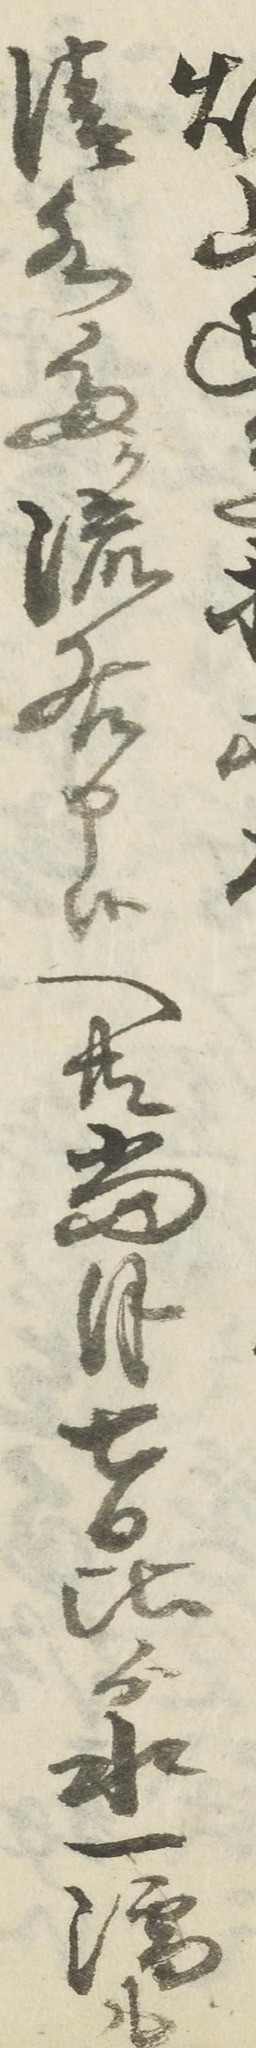清水多ク流居申候へ共当月七日比ゟ水一滴も
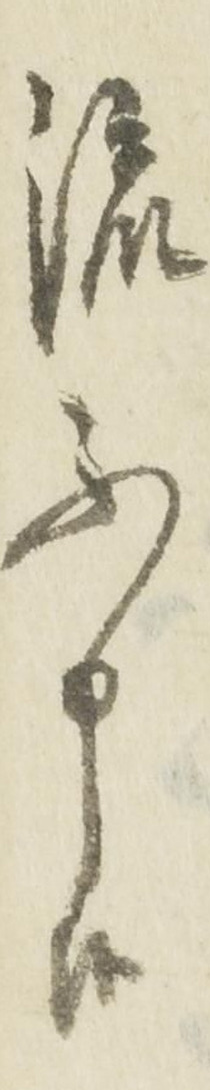流不申候
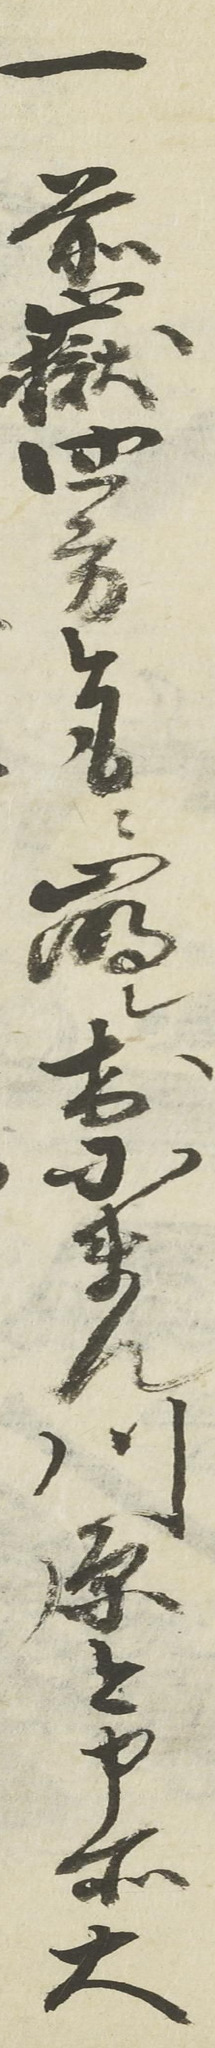一前嶽四方ともニ崩レ出にまん川原と申所大
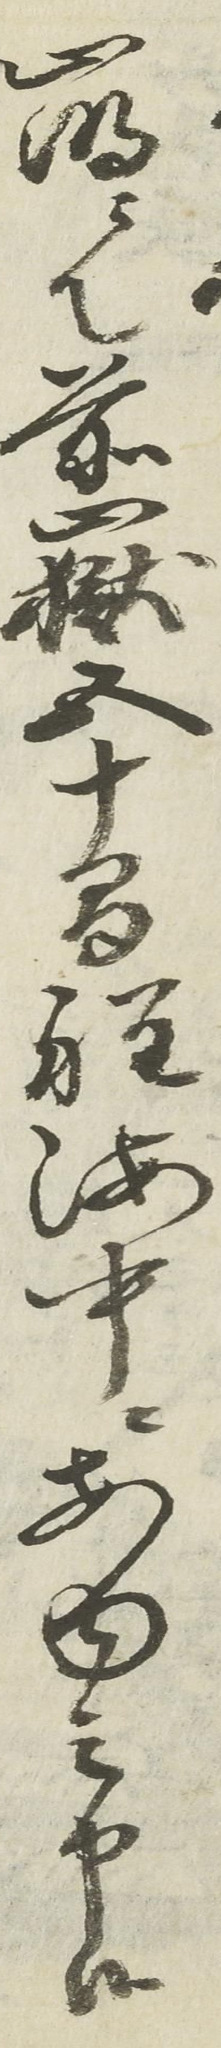崩ニて前嶽五十間程海中ニあゆみ申候
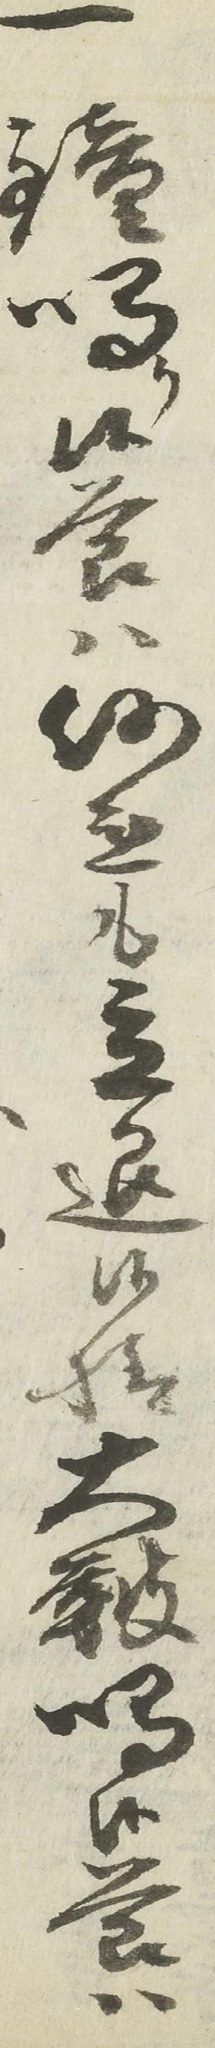一鐘鳴り候節は何れも立退候様太鼓鳴候節は
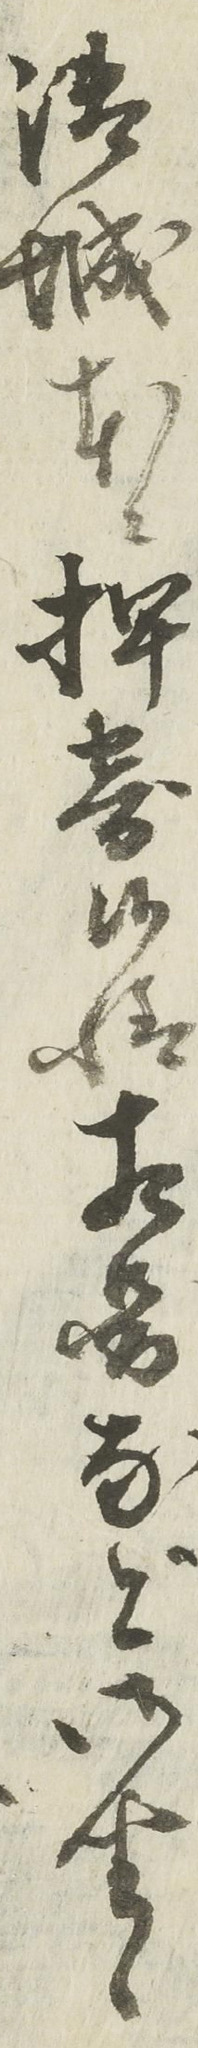御城本ニ押寄候様相図など御坐候
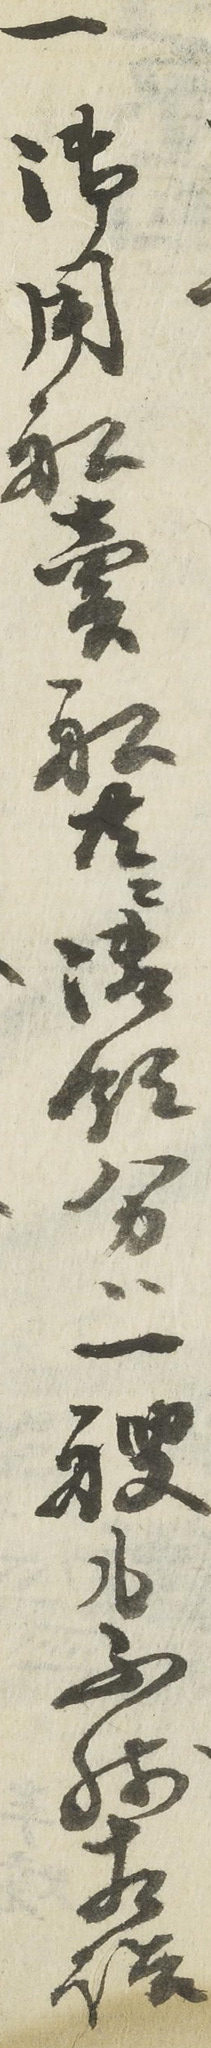一御用舩売舩共ニ御領分は一艘も不残相詰
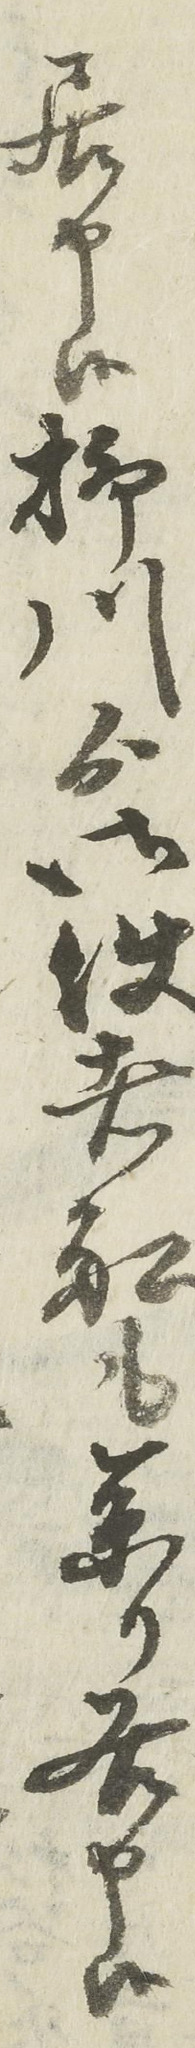居申候柳川ゟ御使者舩も参り居申候
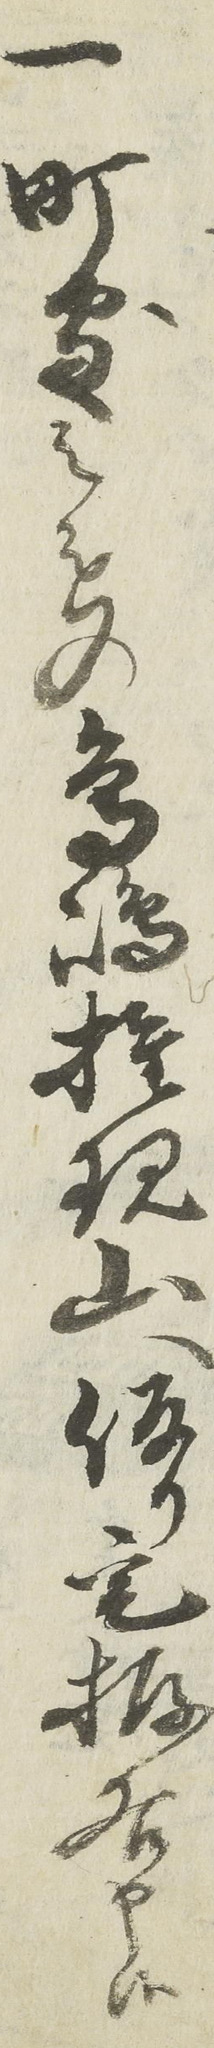一町家之もの鳥嶋権現山へ仮り宅拵居申候
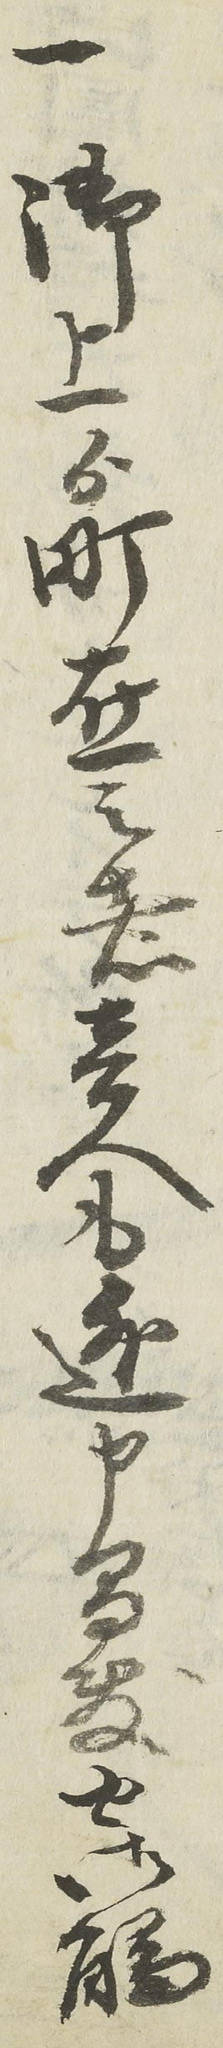一御上ゟ町在之者壱人も逃申間敷由御触
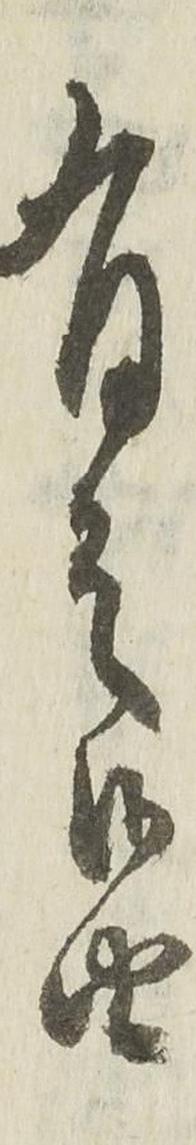有之候由
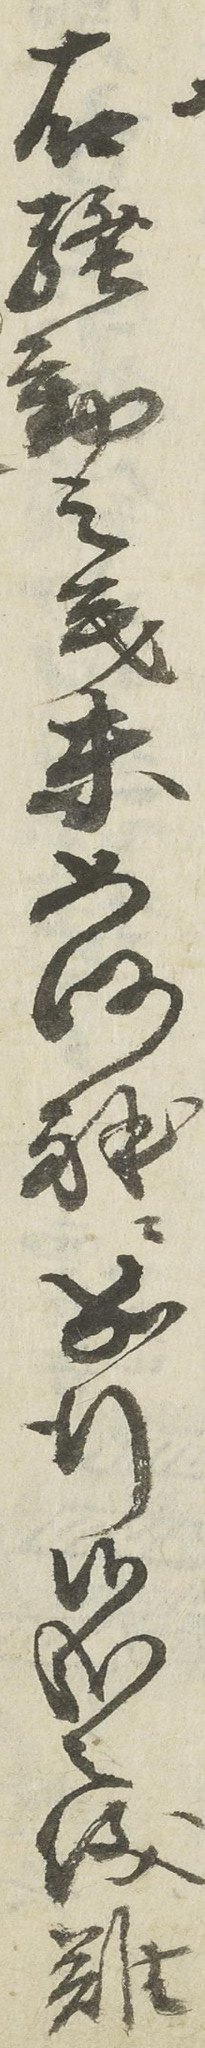右騒動之義未如何躰ニ成行候哉之儀難
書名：後見笑
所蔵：東京大学地震研究所図書室 Earthquake Research Institute Library, The University of Tokyo, JAPAN
